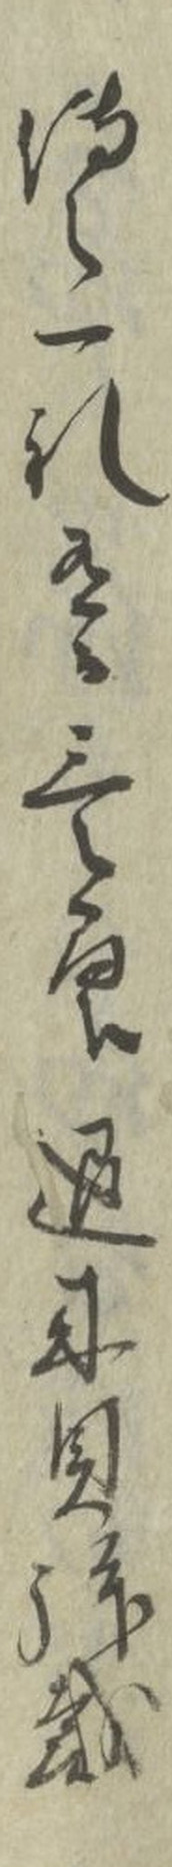伝之一礼有而三之間え退来貝拝戴
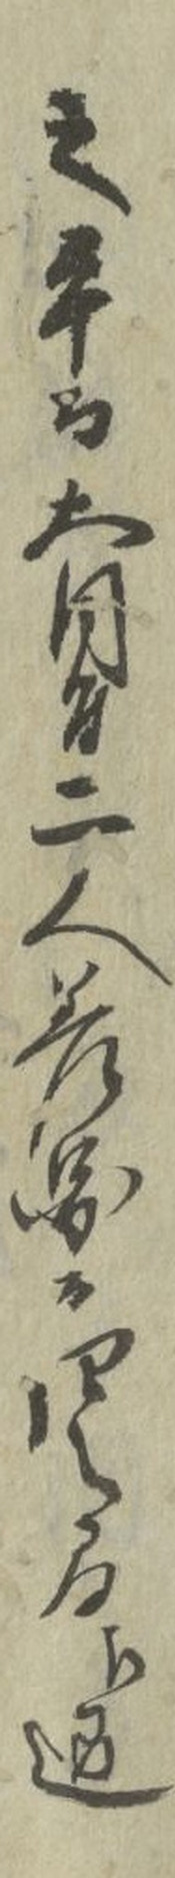之畢而大目付二人差図而四之間え退
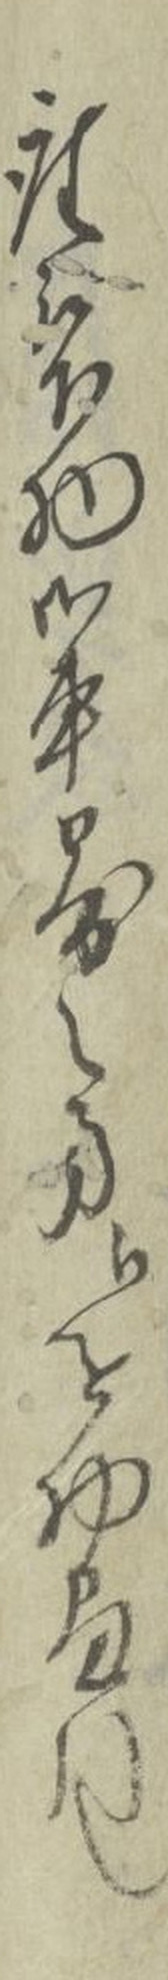座被下物御車寄之方え進物番引之
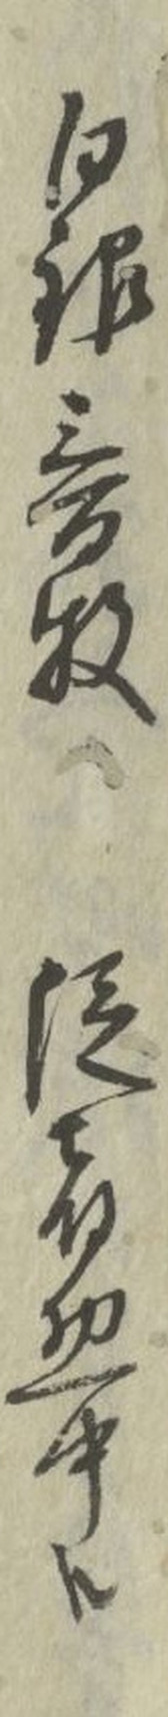白銀三百枚従者惣中え
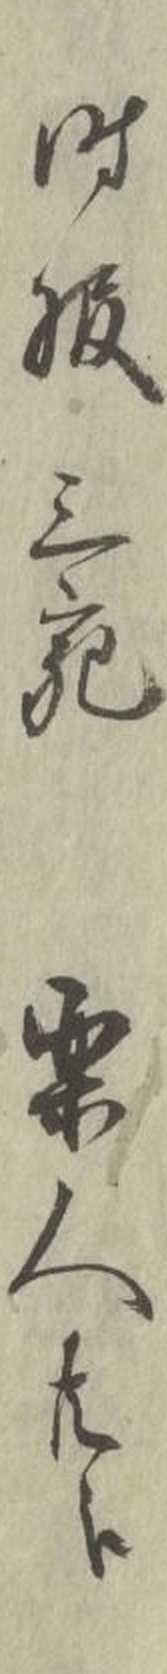時服三宛楽人共え
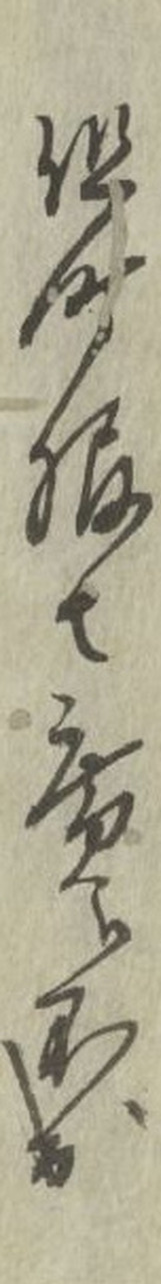但時服は席え不出
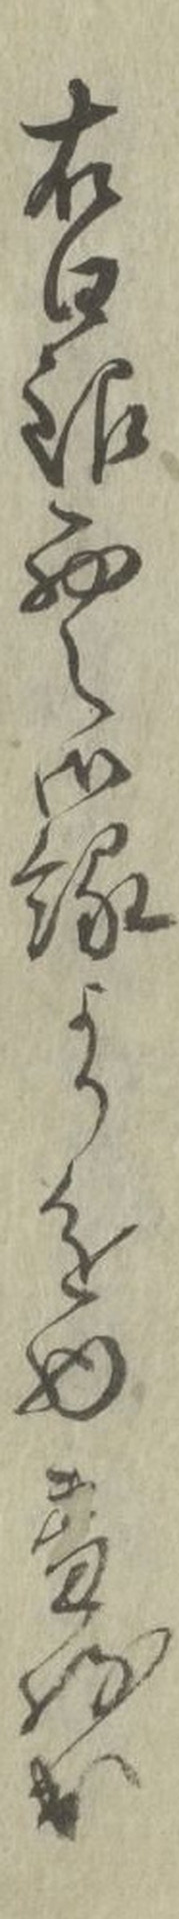右白銀西之御縁より進物番持出

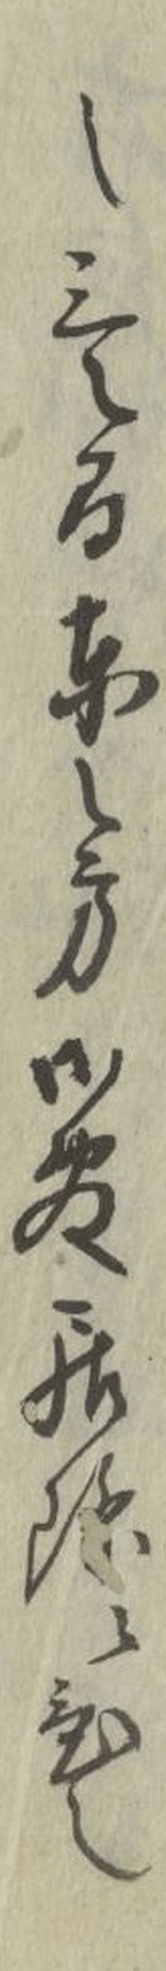之三之間東之方御敷居際に置之
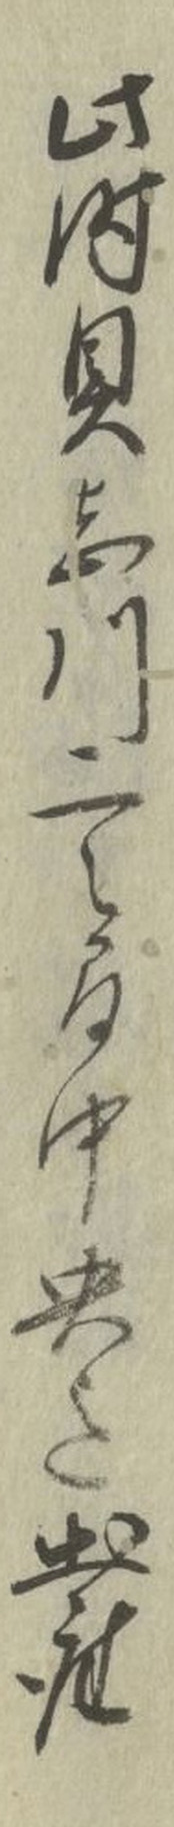此時具志川二之間中央迄出座
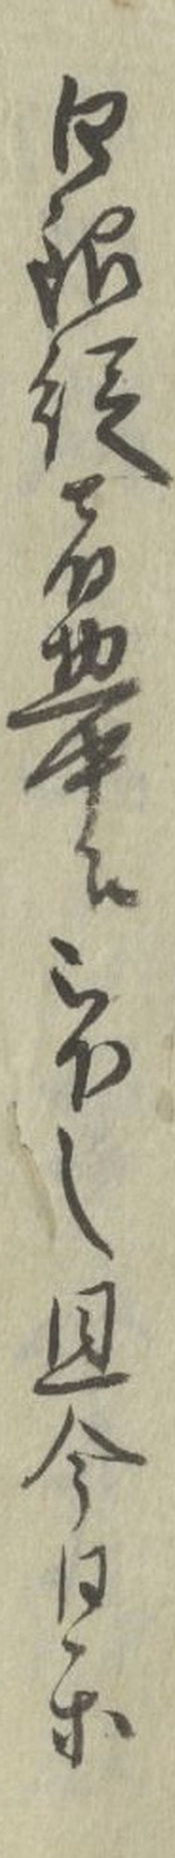白銀従者惣中え被下之且今日楽
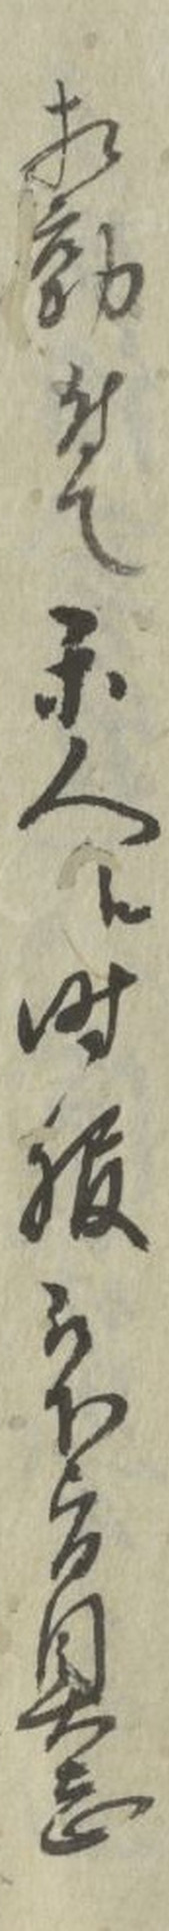相勤付て楽人え時服被下旨具志
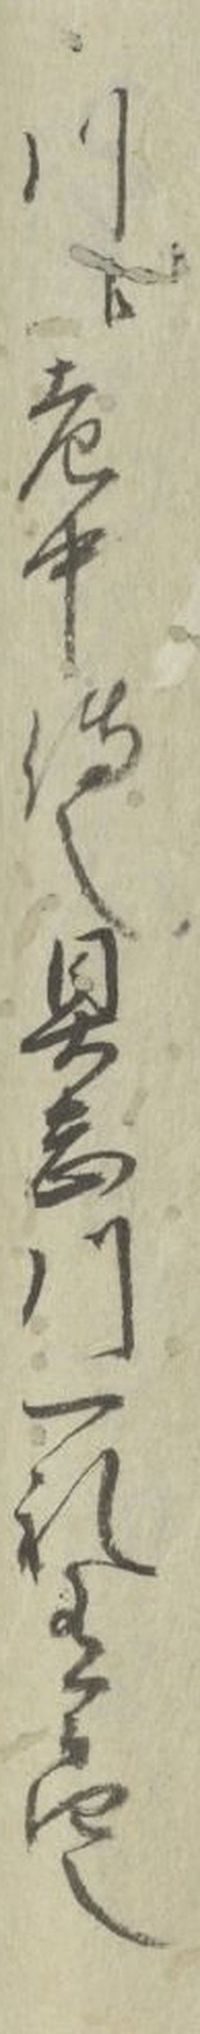川え老中伝之具志川一礼有而四之
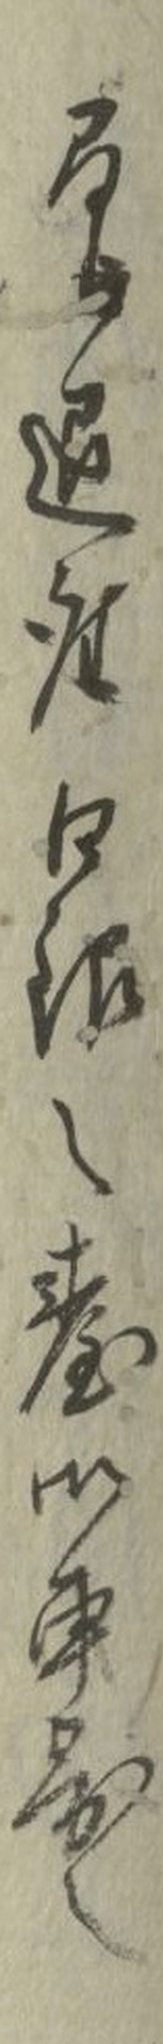間え退座白銀之台御車寄之
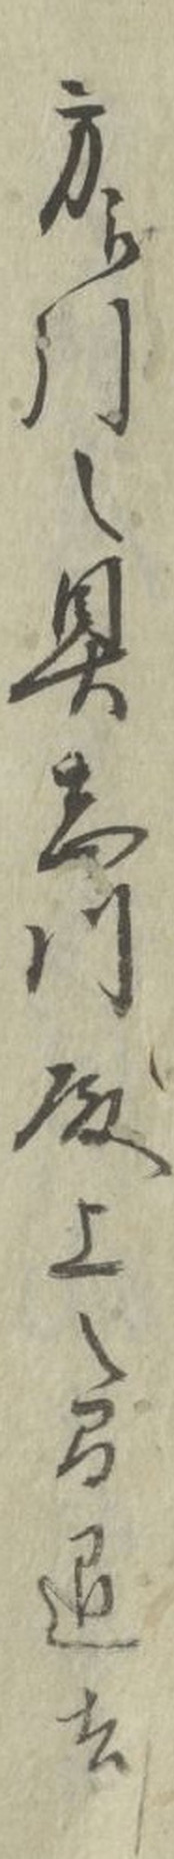方え引之具志川殿上之間退去
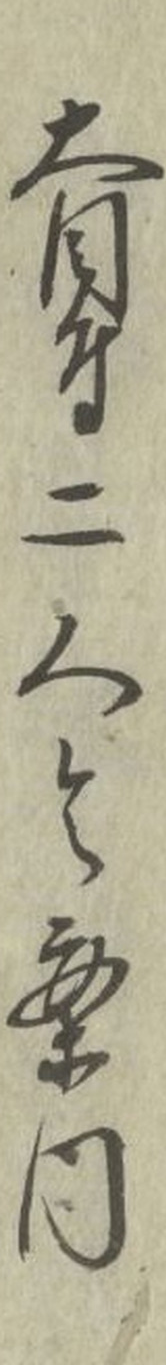大目付二人令案内
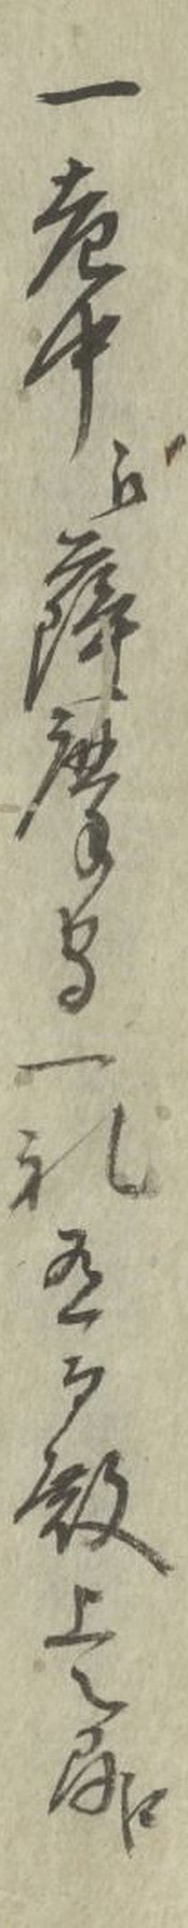一老中え薩摩守一礼有而殿上之間え
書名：琉球来朝記 自八至十四終
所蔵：University of the Ryukyus Library
